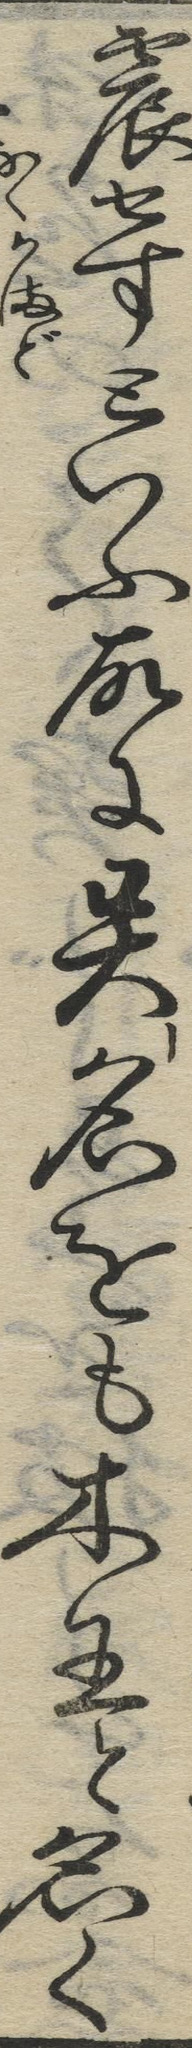震セすといふ故に異名をも木王と名く
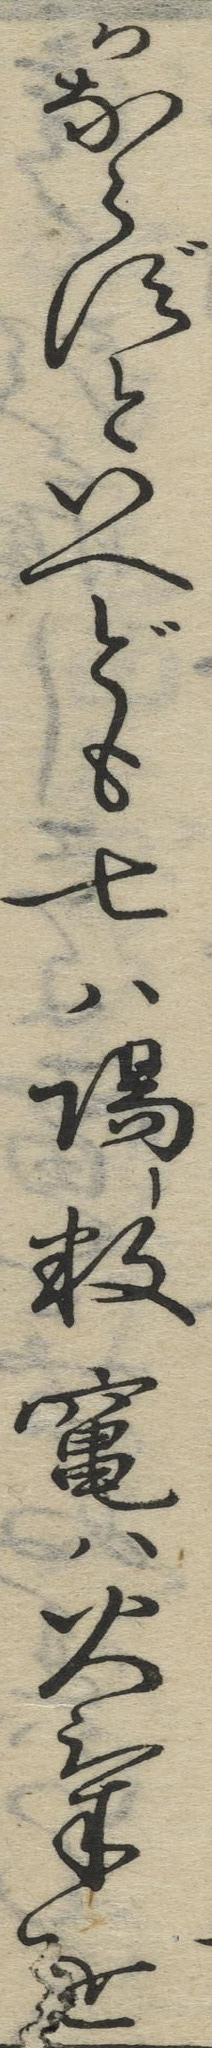かならずといへども七ハ場ノ数竃ハ火気を
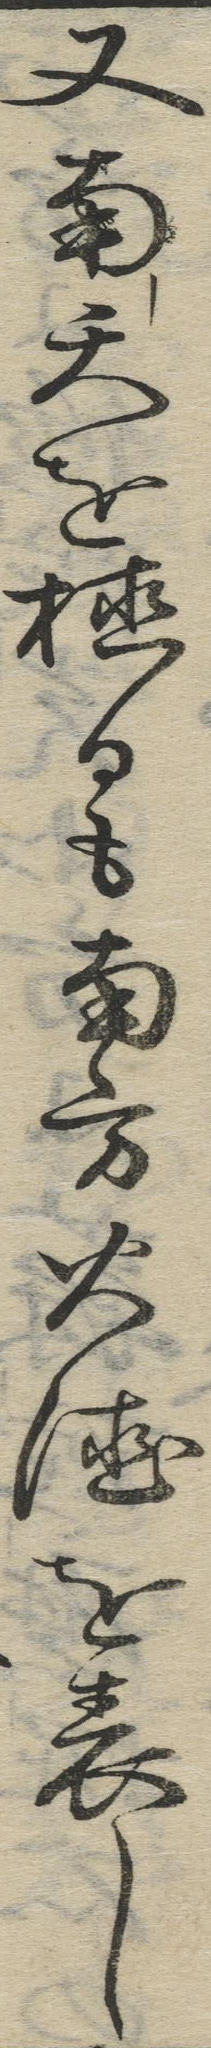又南天を植るも南方火徳を表し
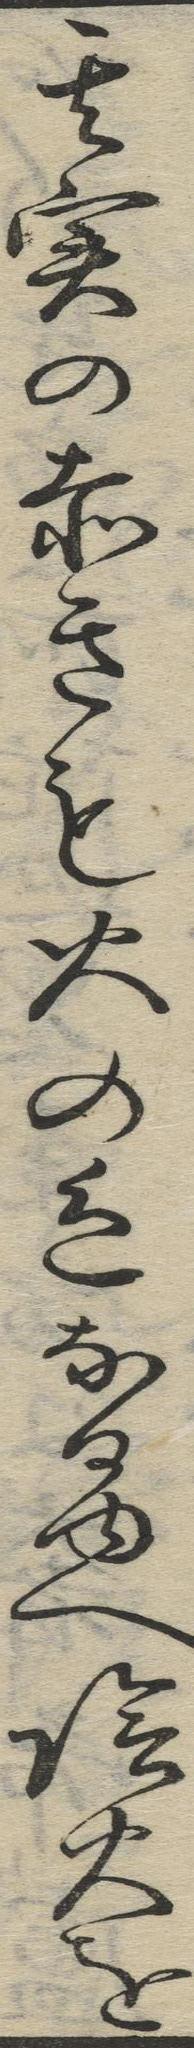其実の赤きも火の色なるゆへ給陰火を
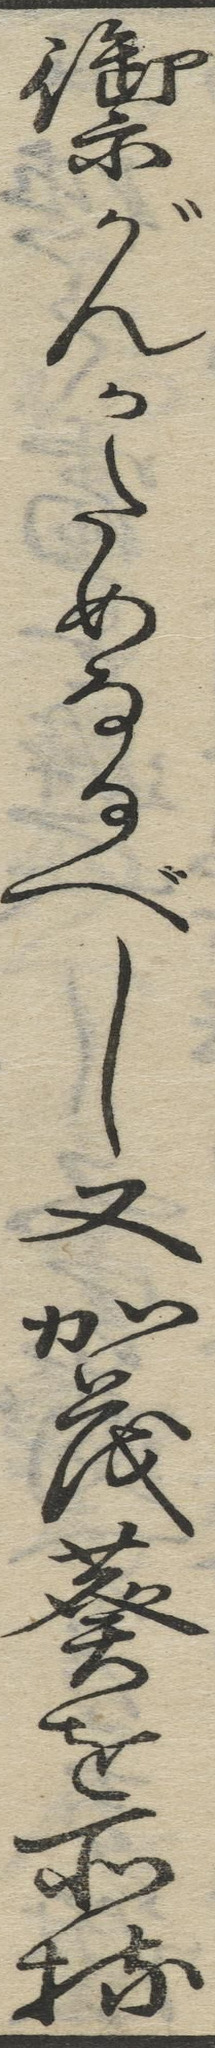禦がんかためなるべし又加茂葵を所持
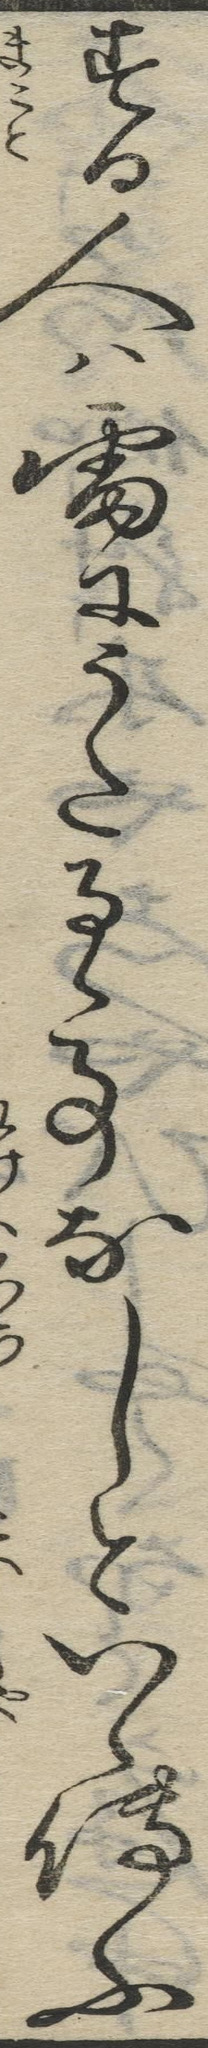する人ハ雷にうたるゝ事なしといゝ伝ふ
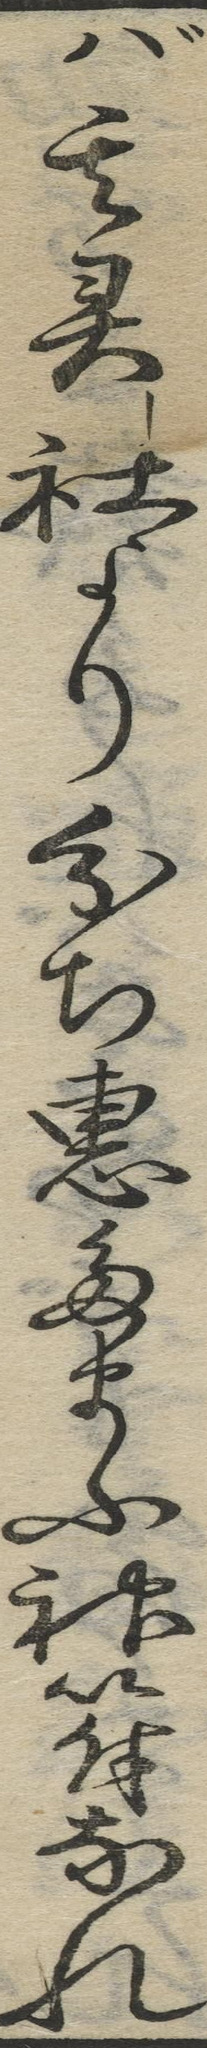バ其霊社より分ち恵たまふ神符なれ
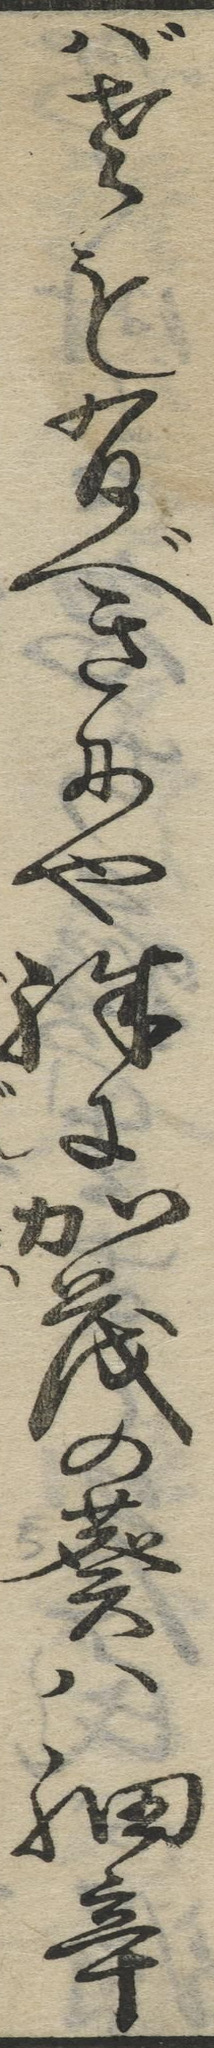バそを有べきにや殊に加茂の葵ハ細辛
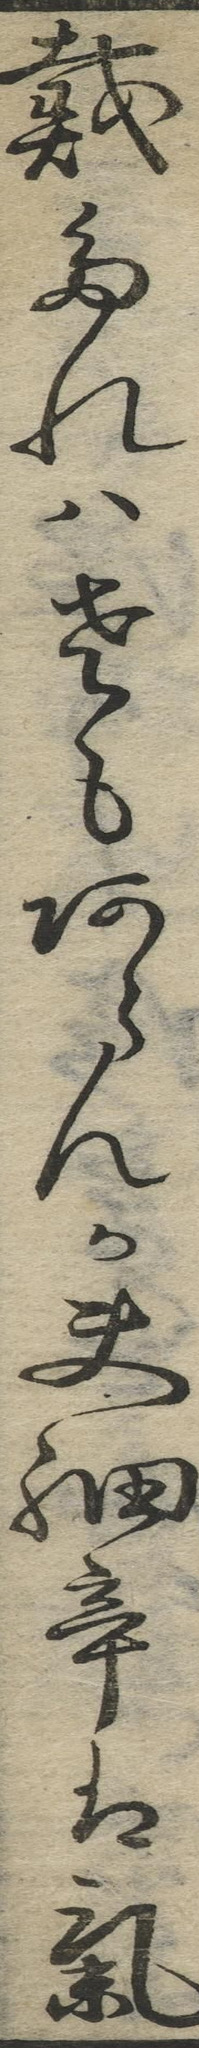載たれハさもあらんか夫細辛は気

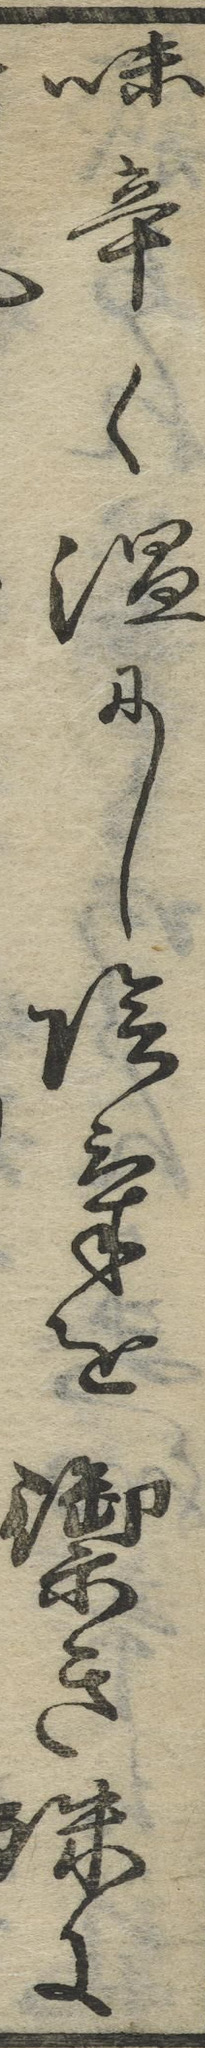味辛く温にし陰気を禦き殊に
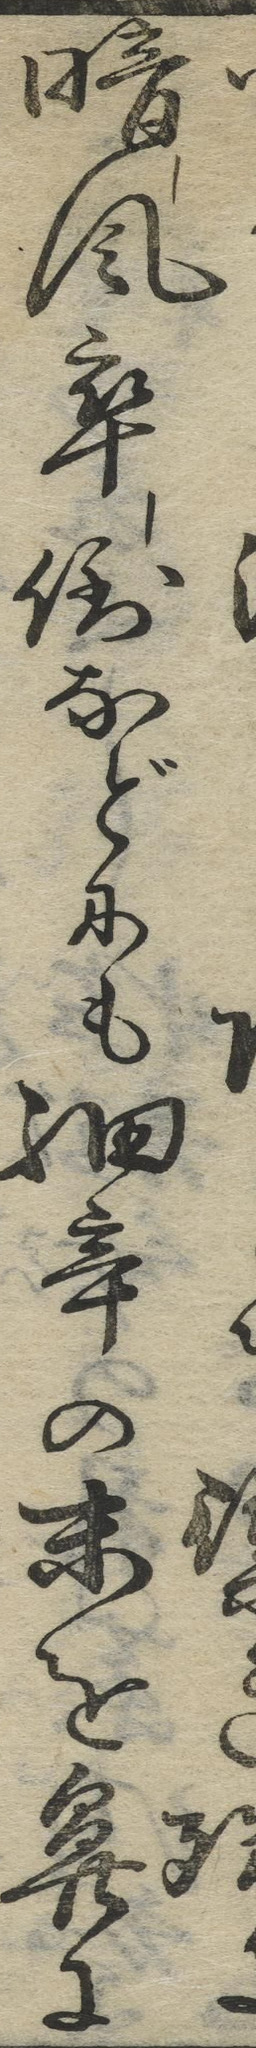暗風卒し倒などにも細辛の末を鼻に
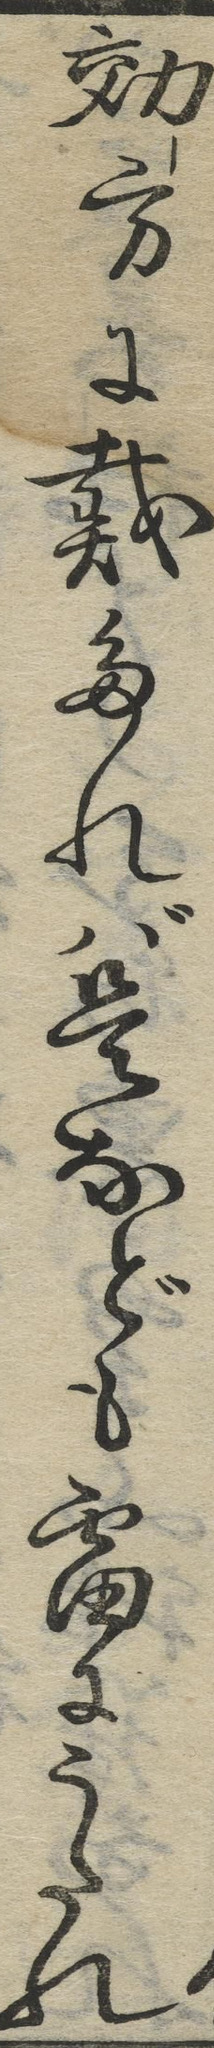効方に載たれバ是なども雷にうたれ
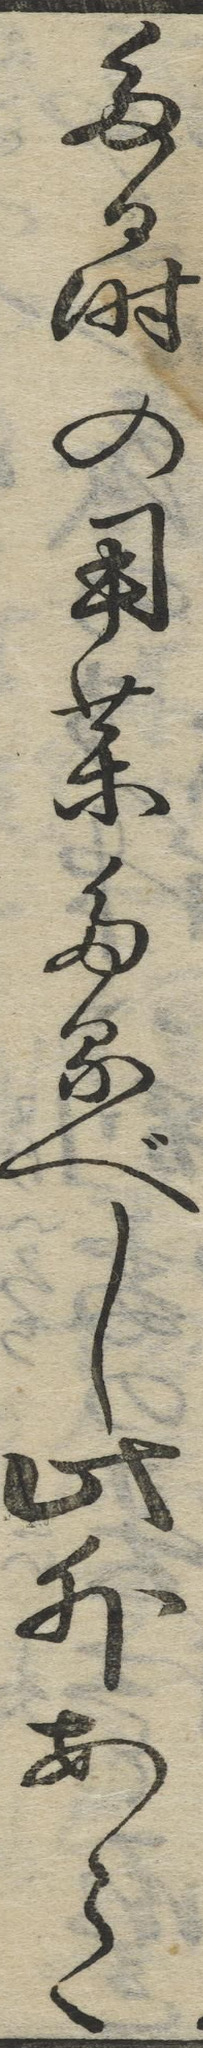たる時の用薬たるべし此外あらた
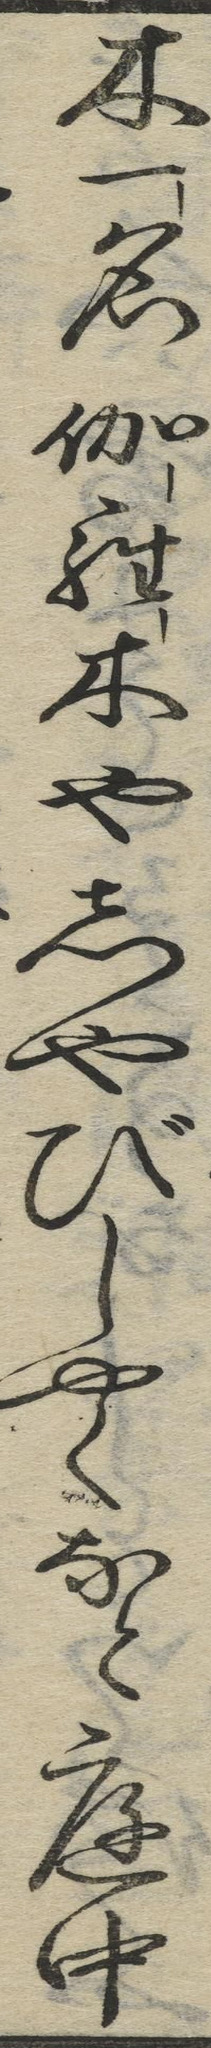木一名伽羅木やしやびしやくなと庭中
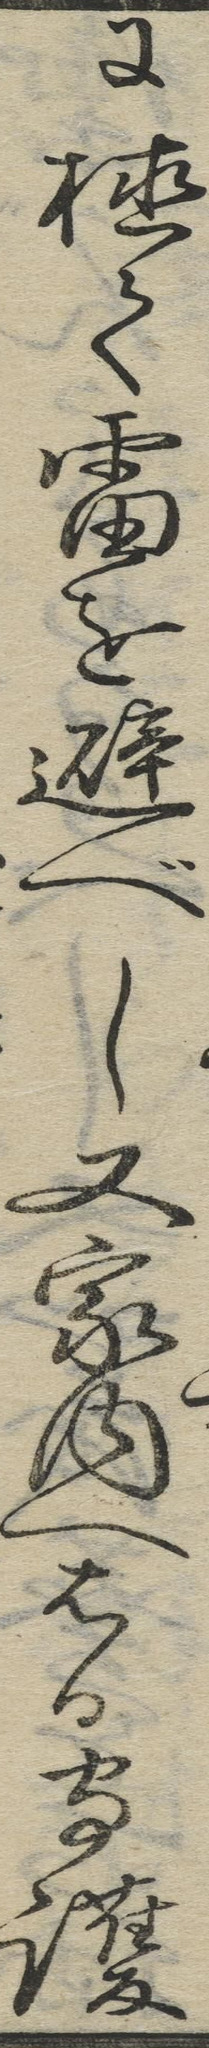に植て雷を避くべし又家内へはる守護
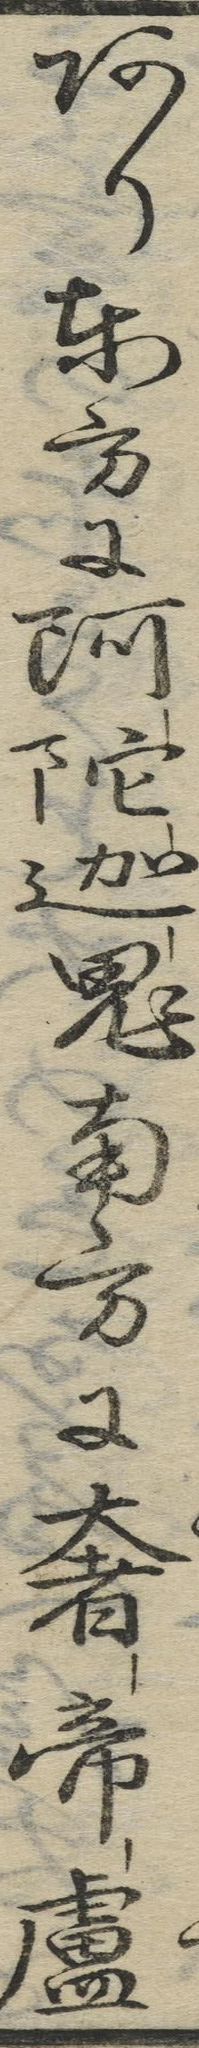あり東方に阿陀迦鬼南方に奢帝盧
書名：雷震記　完
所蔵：東京大学地震研究所図書室 Earthquake Research Institute Library, The University of Tokyo, JAPAN
